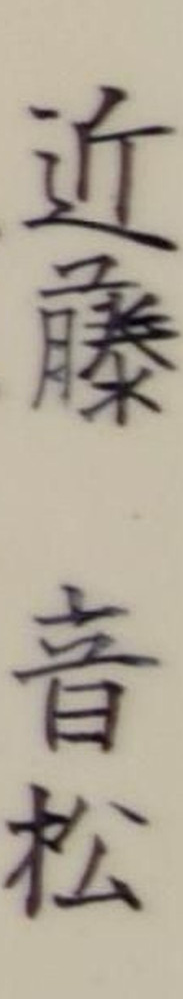近藤音松
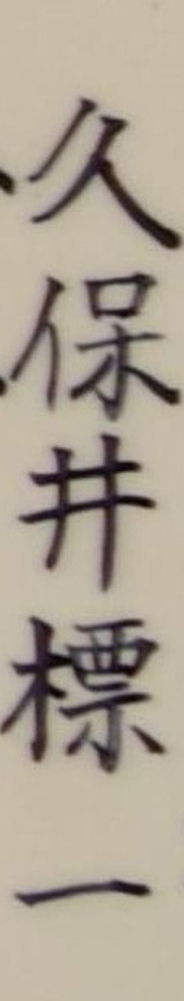久保井標一
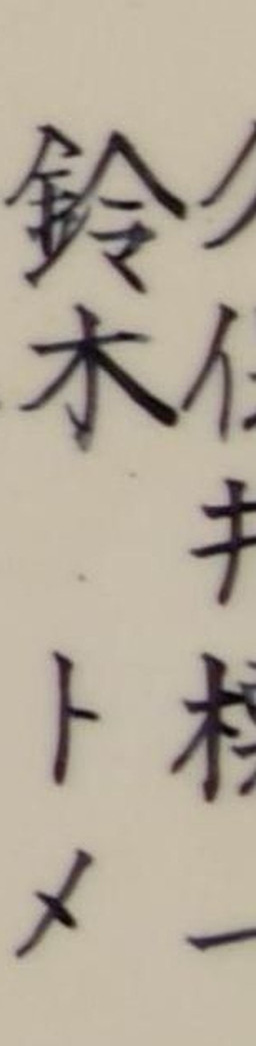鈴木トメ
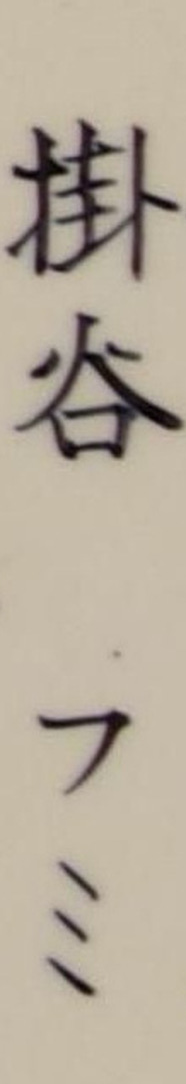掛谷フミ
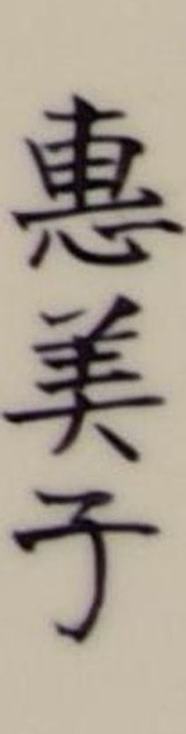恵美子
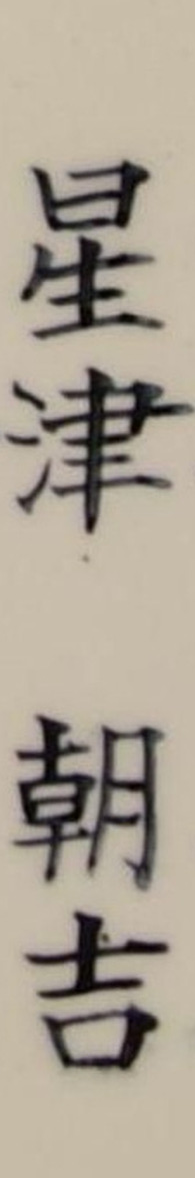星津朝吉
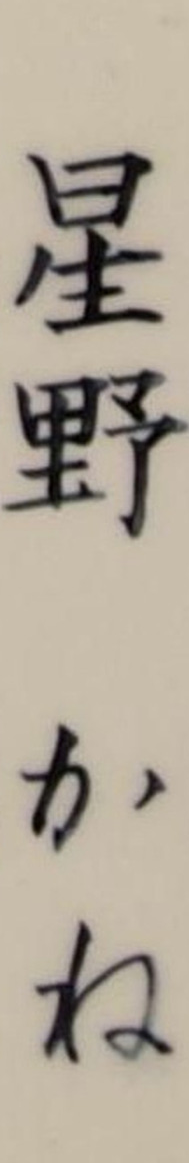星野かね
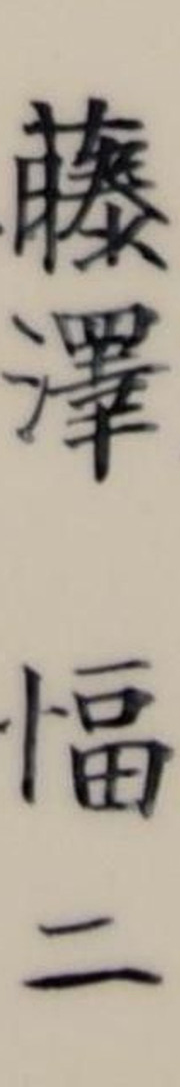藤澤幅二
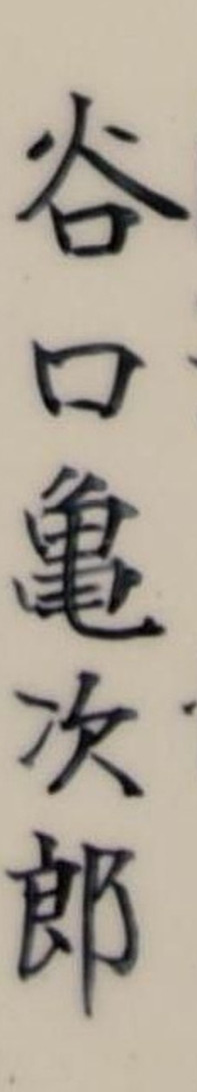谷口亀次郎
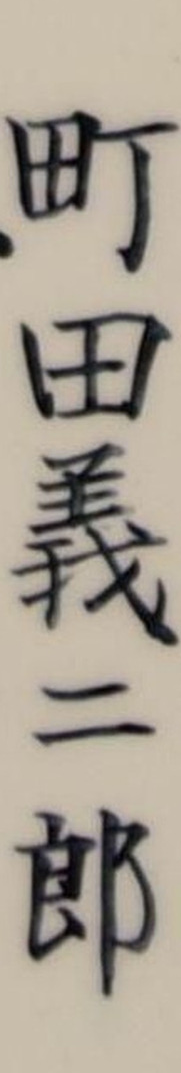町田義二郎
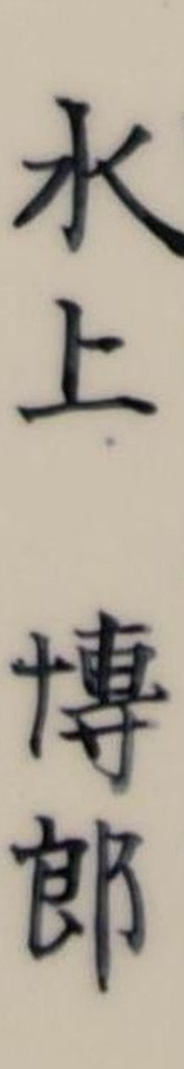水上博郎
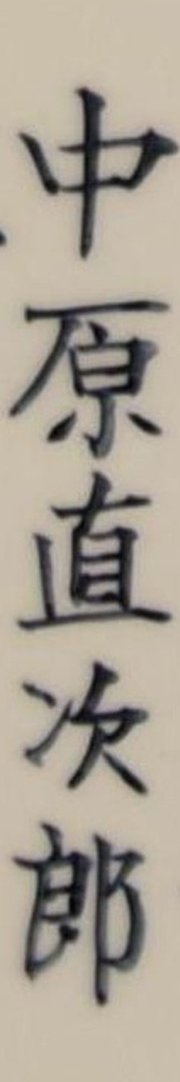中原直次郎
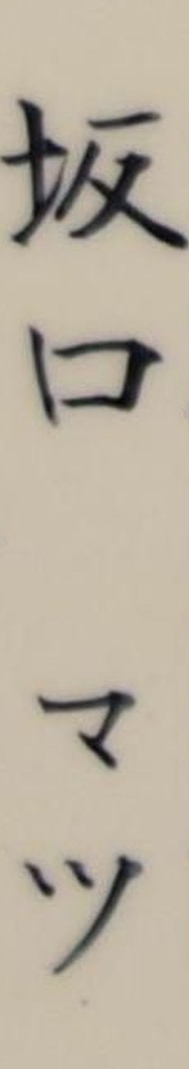坂口マツ
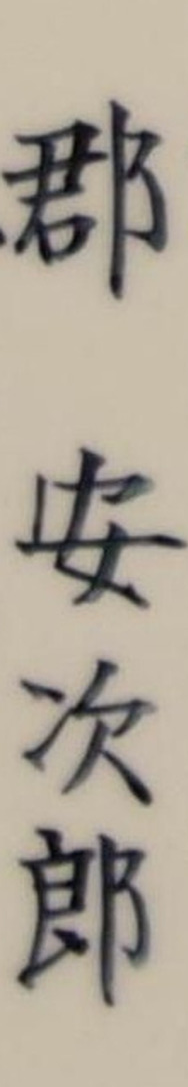郡安次郎
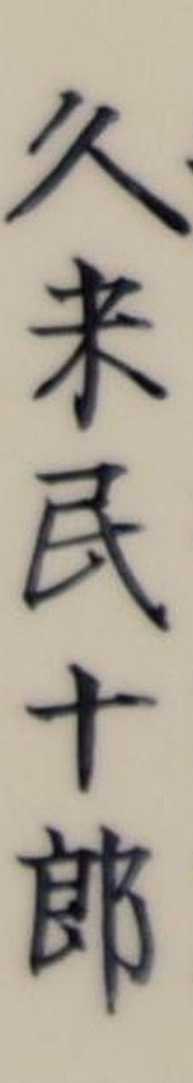久米民十郎
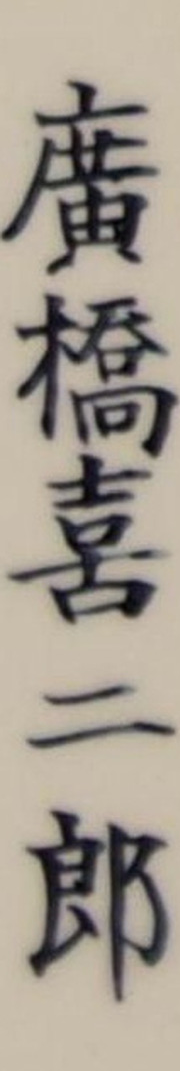廣橋喜二郎
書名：M~S
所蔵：高野山金剛峯寺
